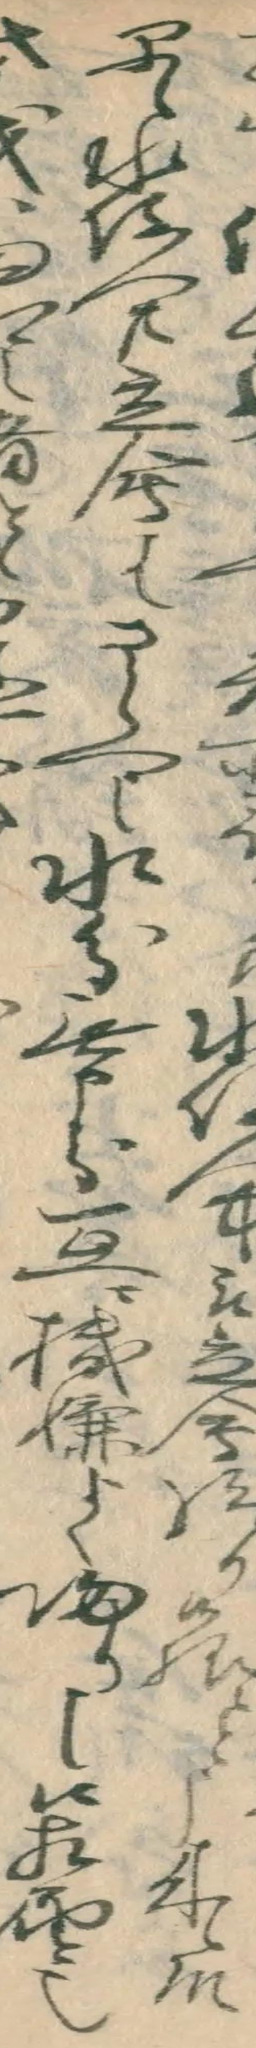早々水役人共立会候てさらへ申候水分無申分互ニ機嫌よく帰り申候由相届也
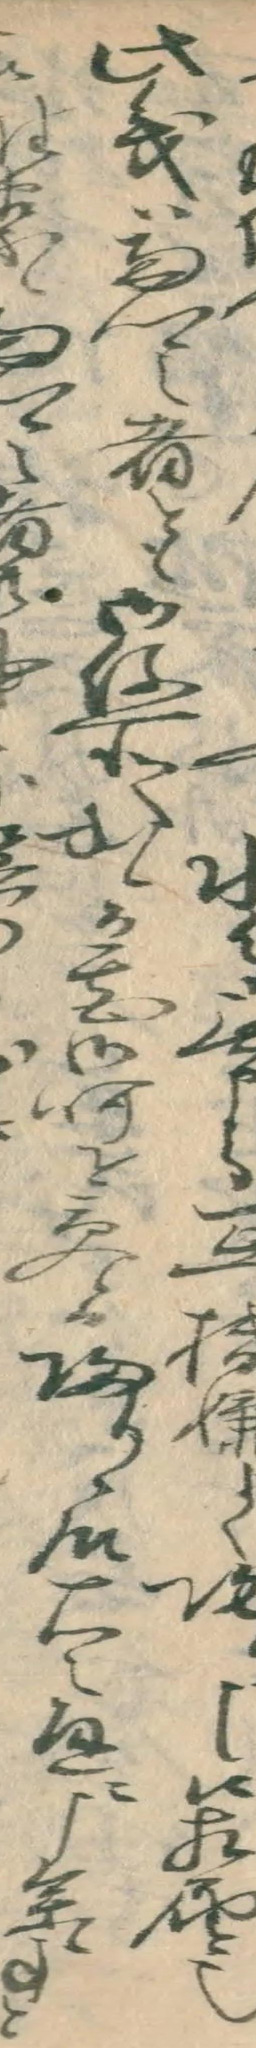此義ハ両郷之者とも御役所へ出候而甚御呵を受候而帰り候故右之通ニ申参候事と
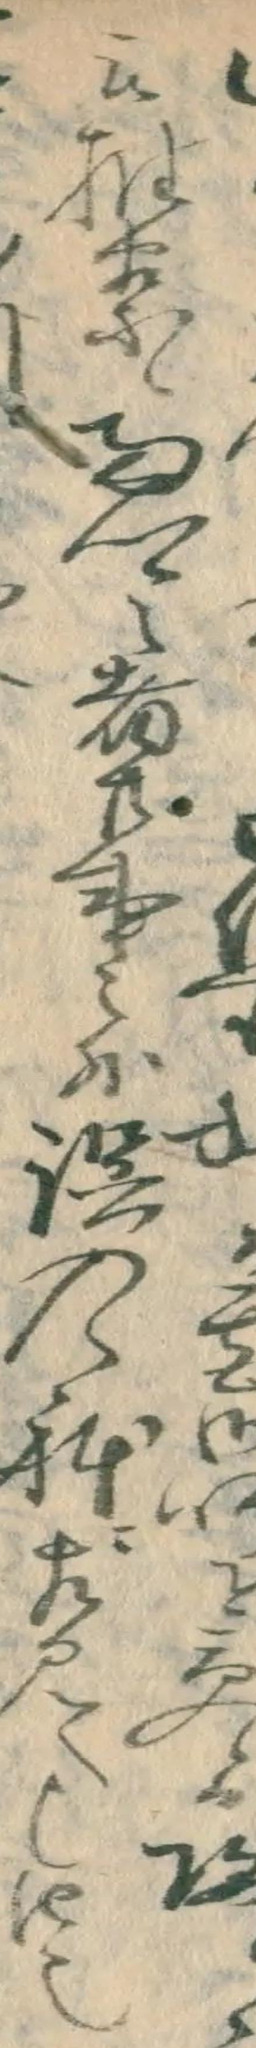被推察候両郷之者共事之外誤入候体ニ相見へ申候由也
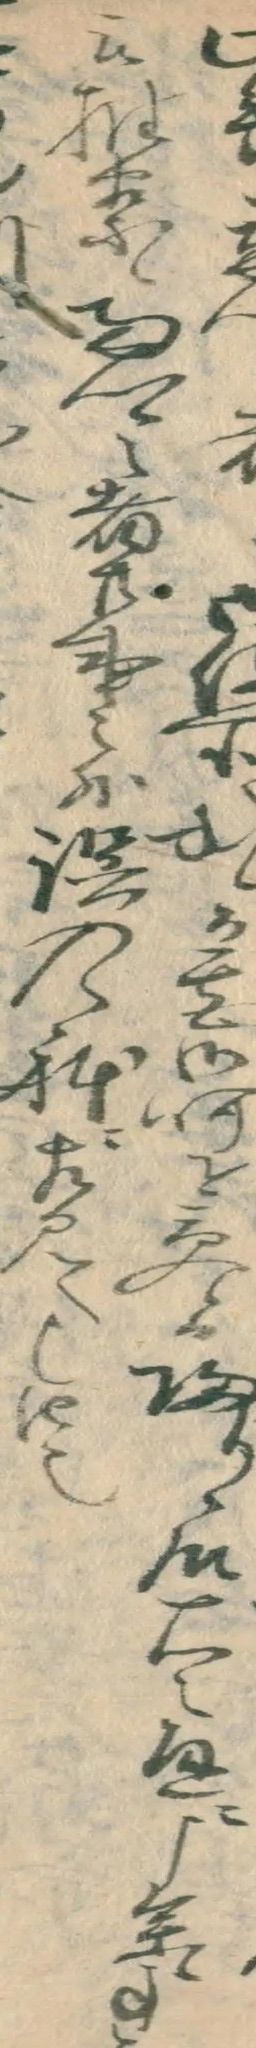被推察候両郷之者共事之外誤入候体ニ相見へ申候由也
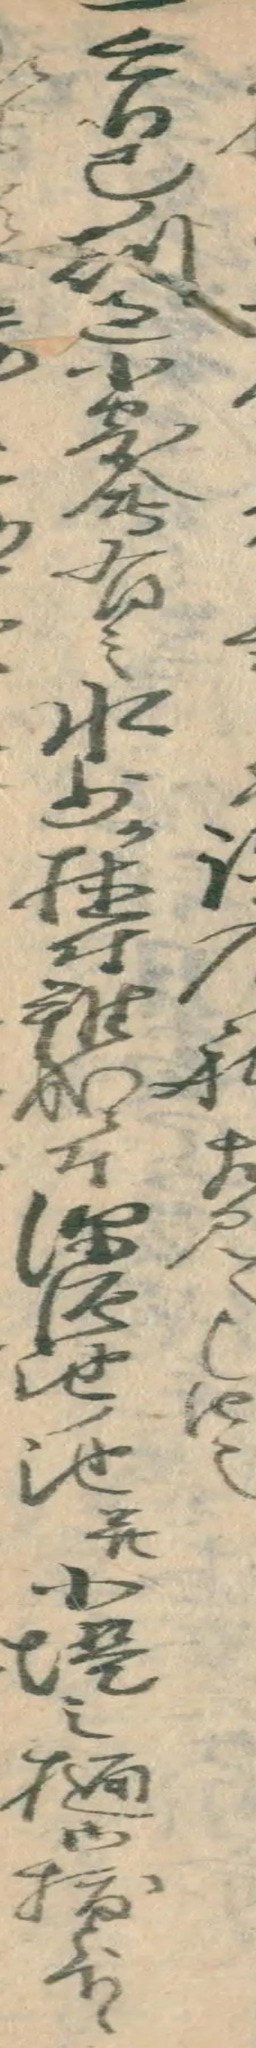一今日巳ノ刻過小寄会有之水少ク植付難成ニ付深泥池ノ池并小堤之樋御抜被下候
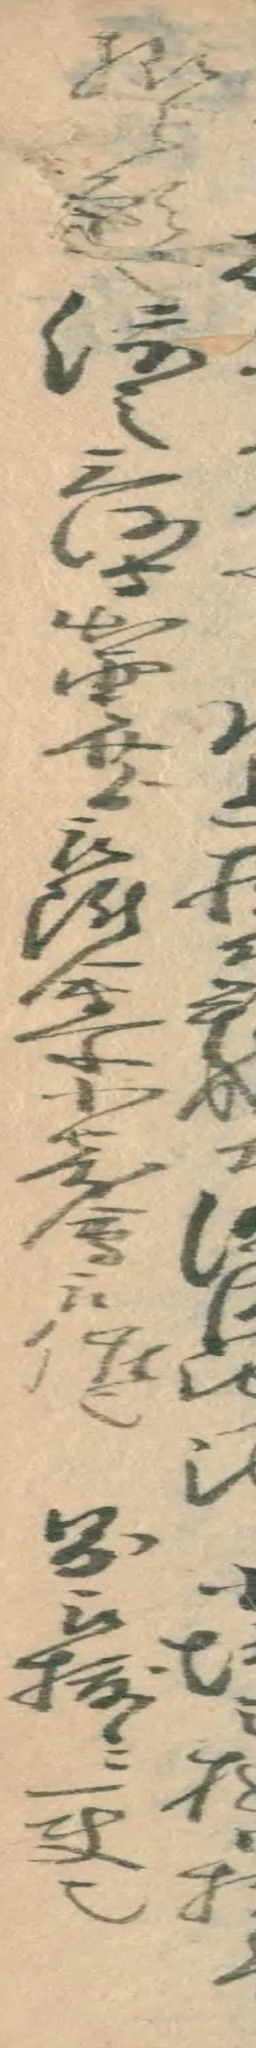様之願也依之三河守出雲介ゟ被付会所小寄会被催也則被抜候ニ一決也

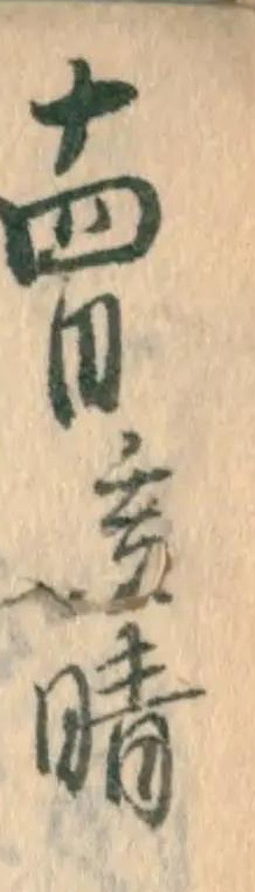十四日亥晴
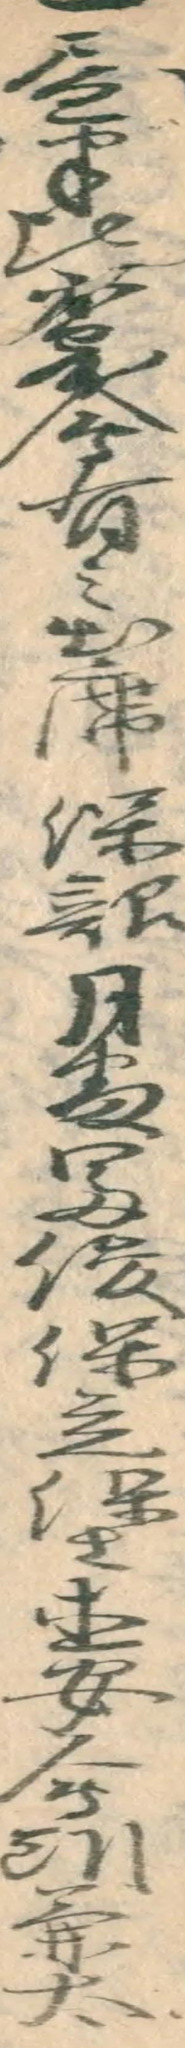一昼半比小寄会有之出席保韶月番富俊保覚保土直安会所兼太
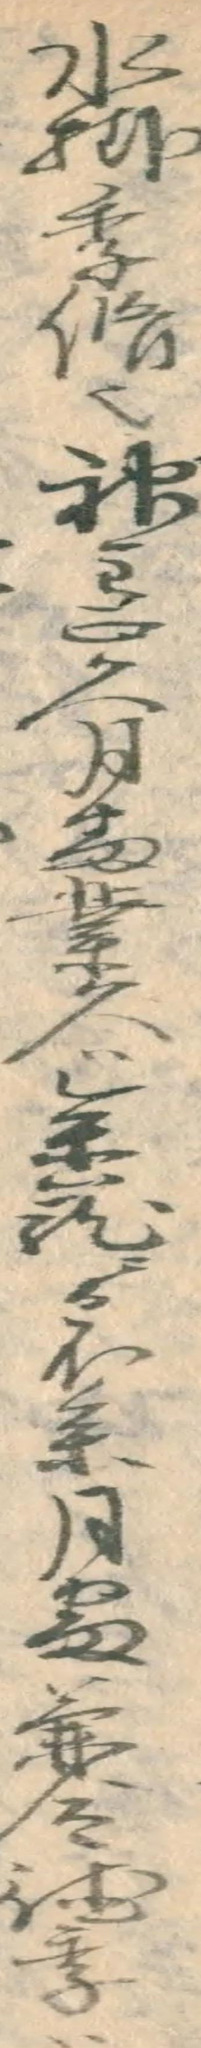水掛季脩也神主正久月番業久ハ参籠ニ而不参月番兼令徳季ハ
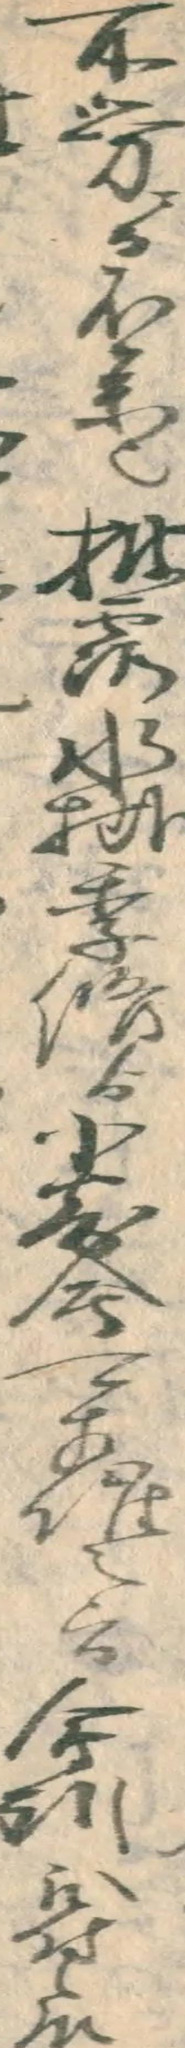所労ニ而不参也披露水掛季脩ゟ小寄会可相催之旨会所へ被付候故
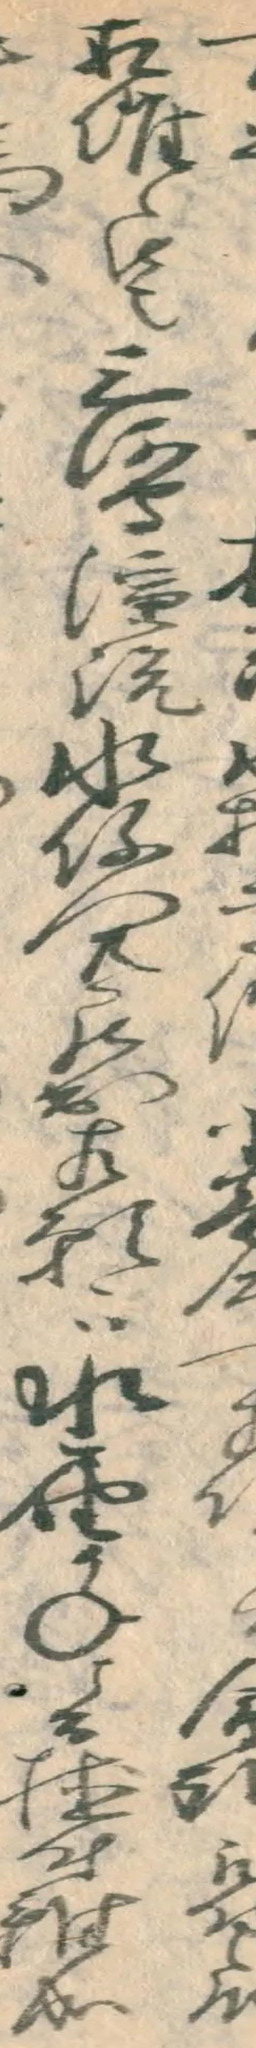相催候由也三河守演説水役人共罷出相願候ハ水届かね候而植付難成
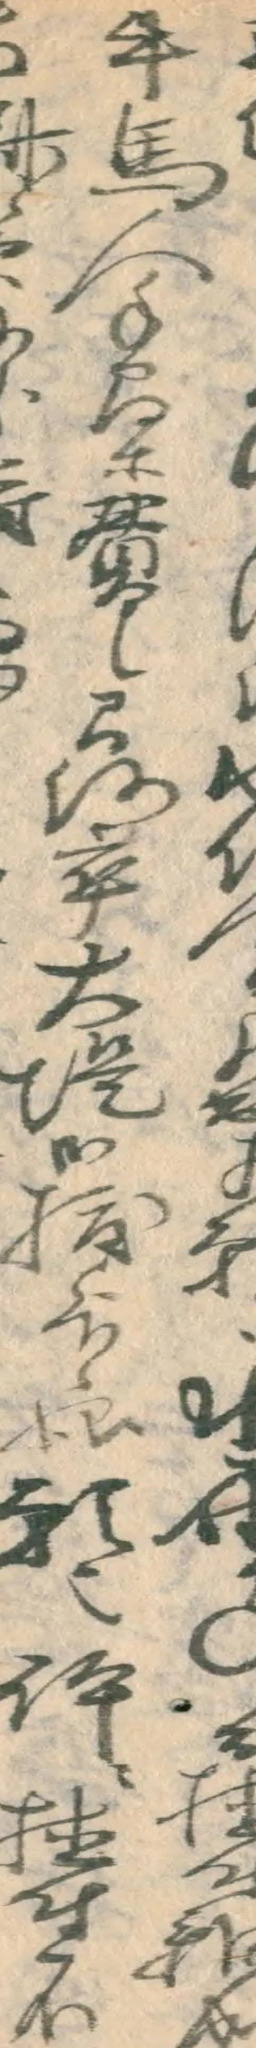牛馬人手間等費し候間何卒大堤御抜被下候様願也評ニ植付不
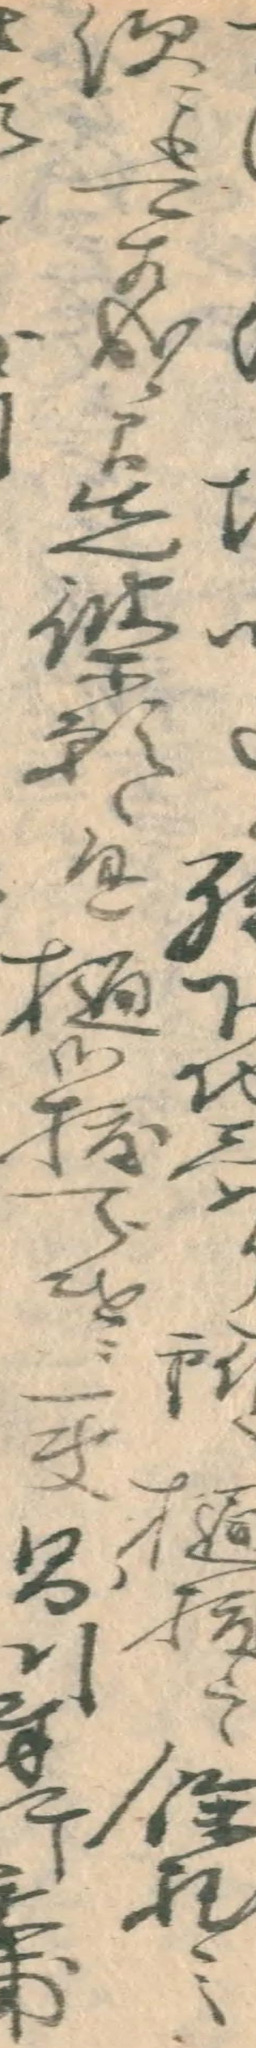便ニも可相成候間先彼等願候通樋御抜可被遣ニ一決則川奉行季甫
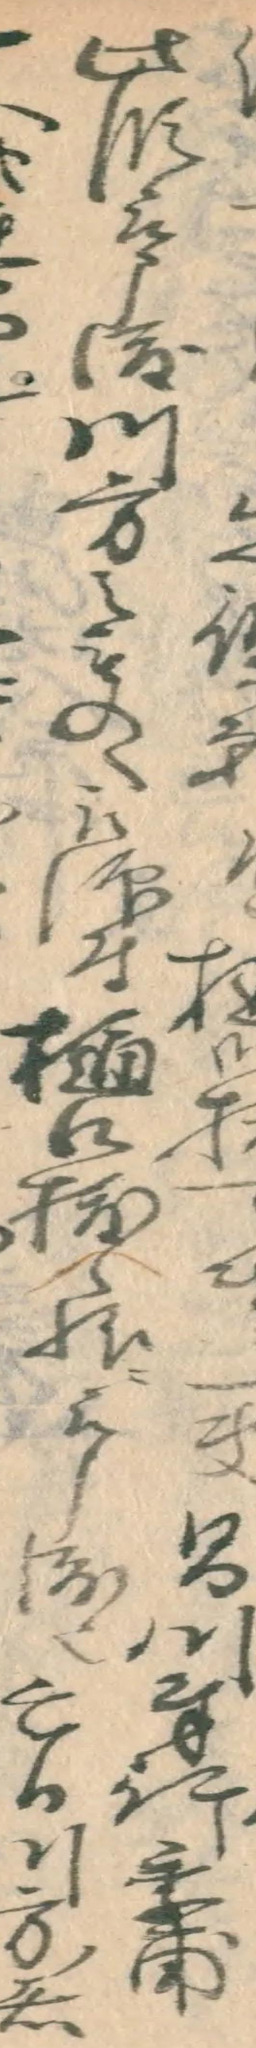此段被申渡川方之ものへ被仰付樋口抜候様ニ被申渡也今日川方ノ者
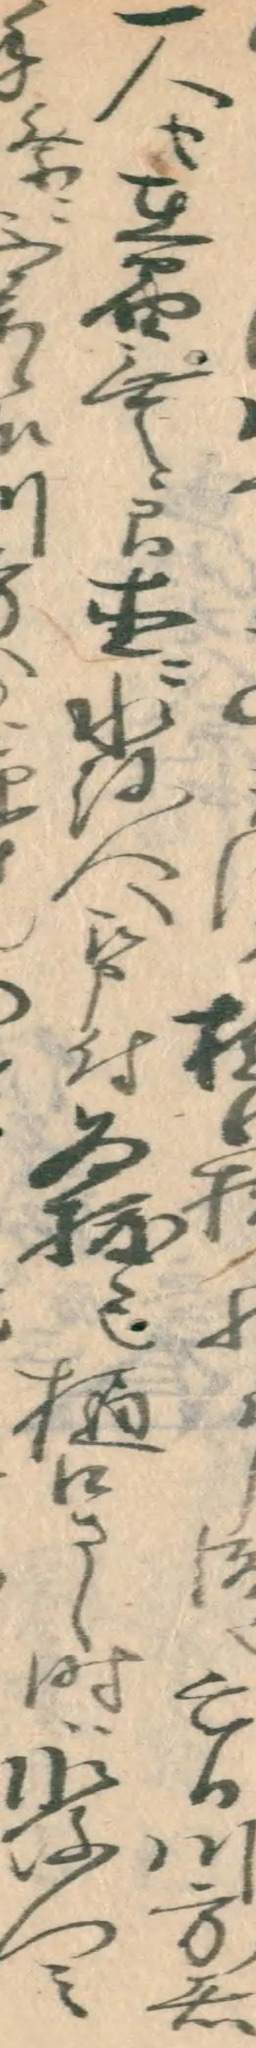一人も在宿無之候間直ニ水役人へ被申付為抜候也樋口さし時ハ水役人之
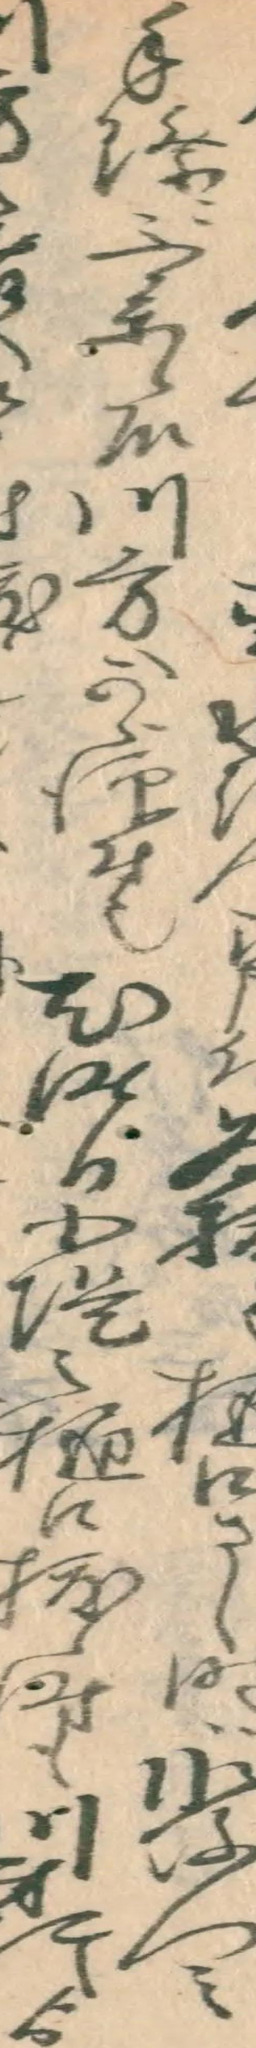手際ニ不参候故川方へ可被仰付也尤昨日小堤之樋口抜候時も川方奉行ゟ
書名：賀茂社記録. 第58冊
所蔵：国立国会図書館 National Diet Library, JAPAN
